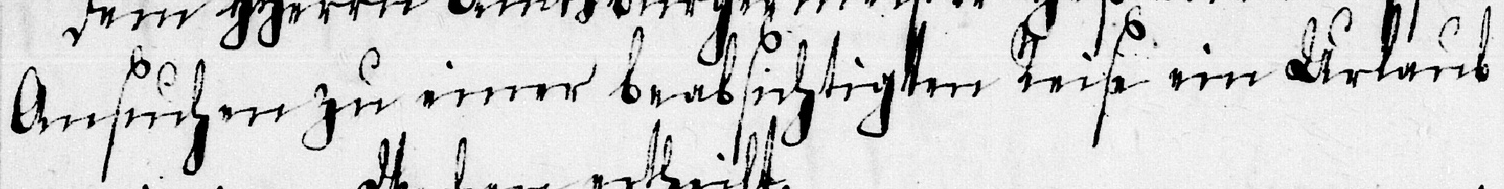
Ansuchen zu einer beabsichtigten Reise ein Urlaub
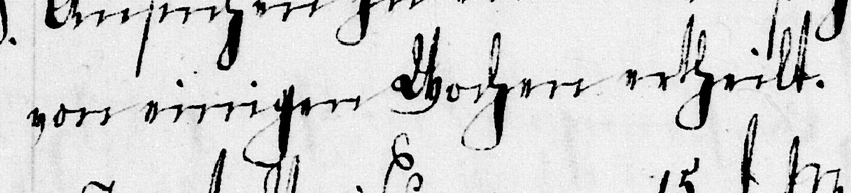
von einigen Wochen ertheilt.
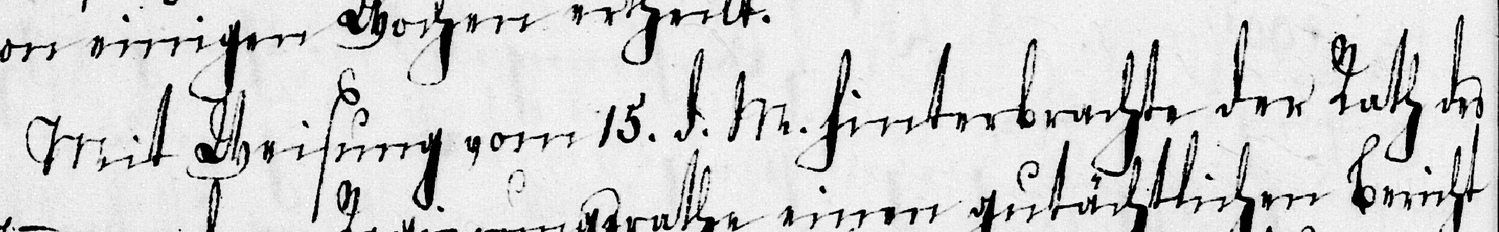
Mit Weisung vom 15. d. M. hinterbrachte der Rath des
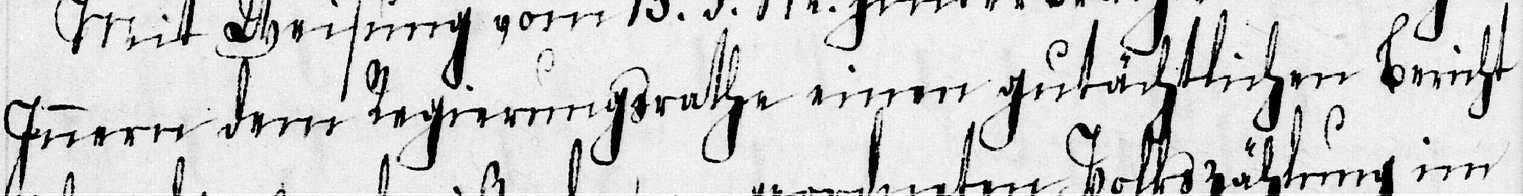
Innern dem Regierungsrathe einen gutächtlichen Bericht
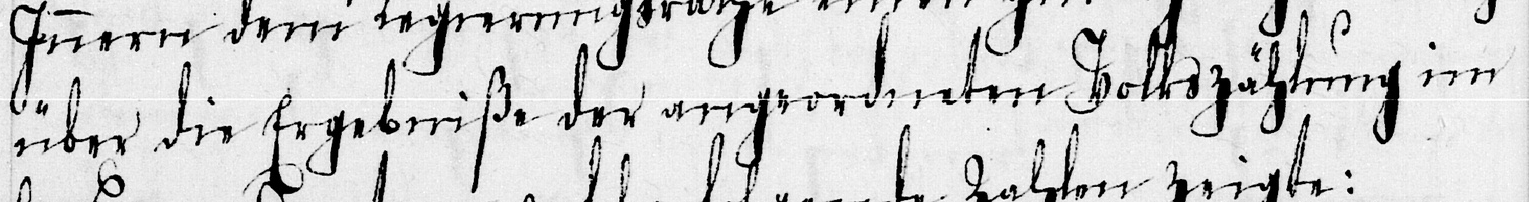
über die Ergebniße der angeordneten Volkszählung im
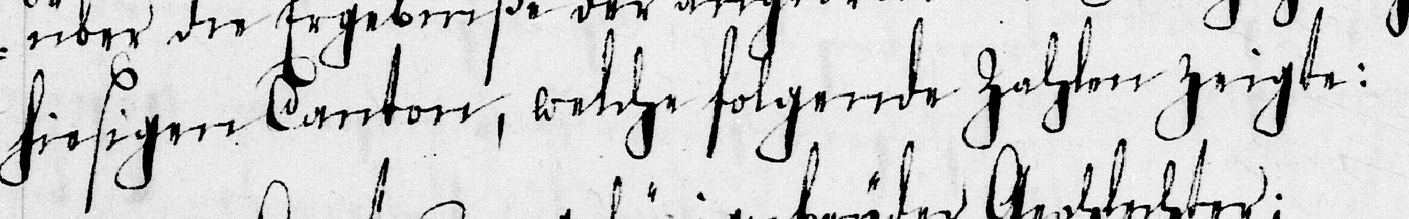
hiesigen Canton, welche folgende Zahlen zeigte:
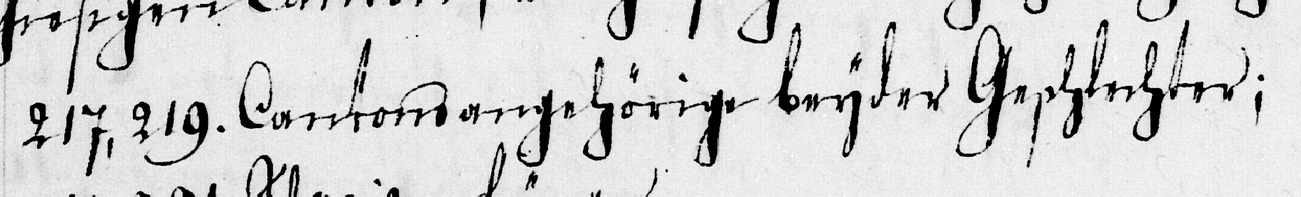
217,219. Cantonsangehörige beyder Geschlechter;
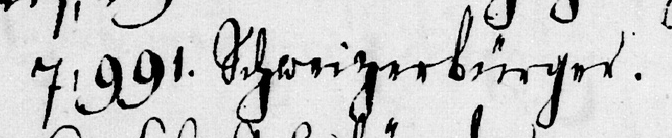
7,991. Schweizerbürger.
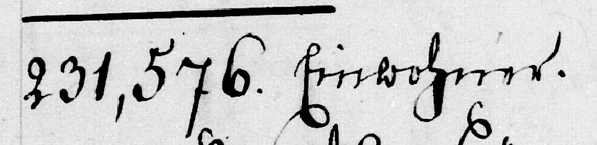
231,576. Einwohner.
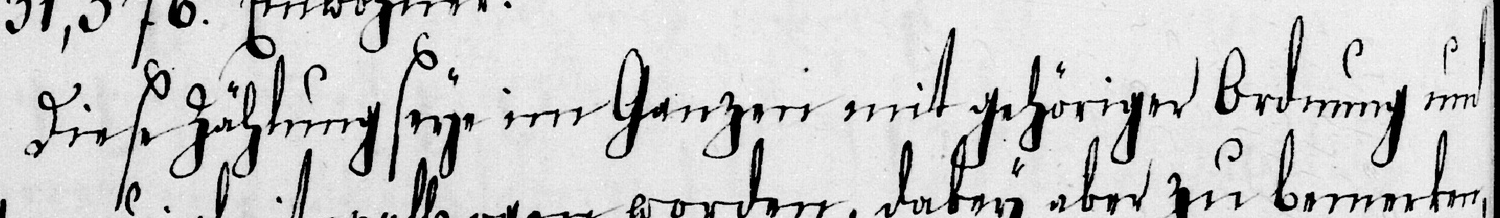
Diese Zählung seye im Ganzen mit gehöriger Ordnung und
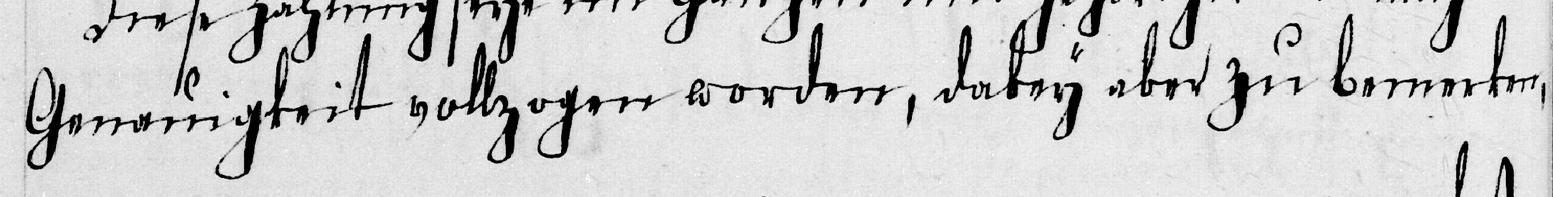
Genauigkeit vollzogen worden, dabey aber zu bemerken,
